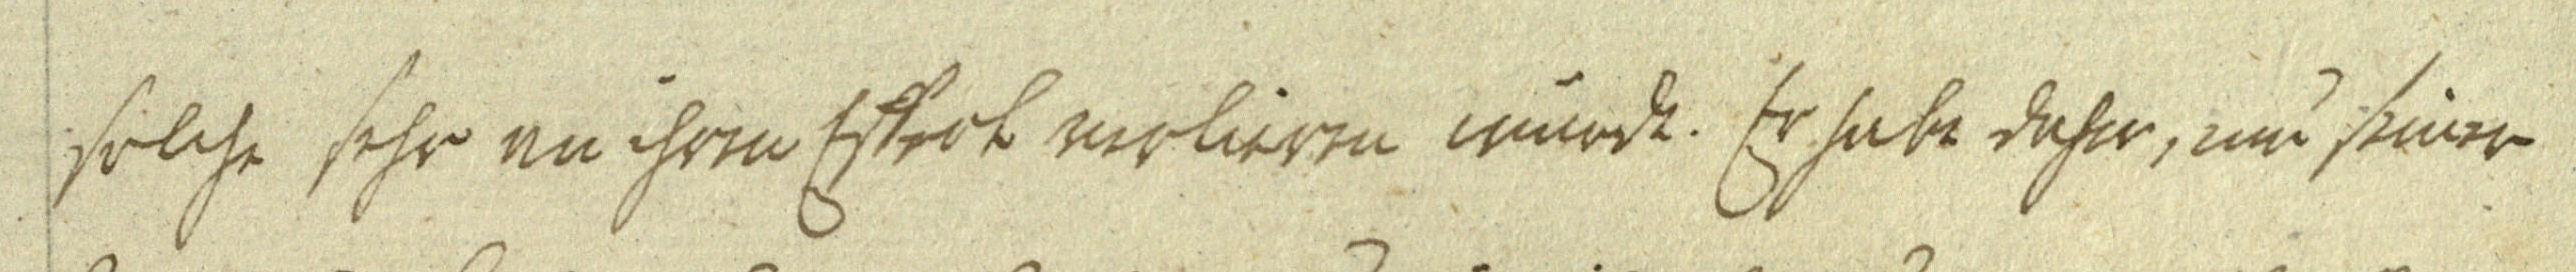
solche sehr an ihrm Effect verlieren würde. Er habe daher, um seiner
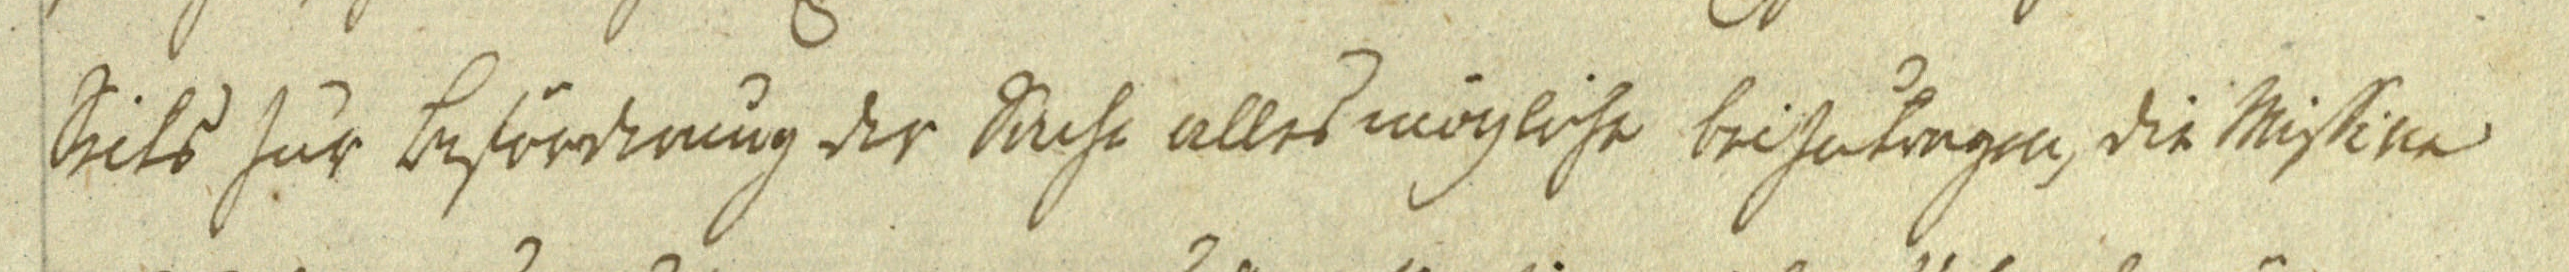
Seits zur Beförderung der Sache alles mögliche beizutragen, die Missive
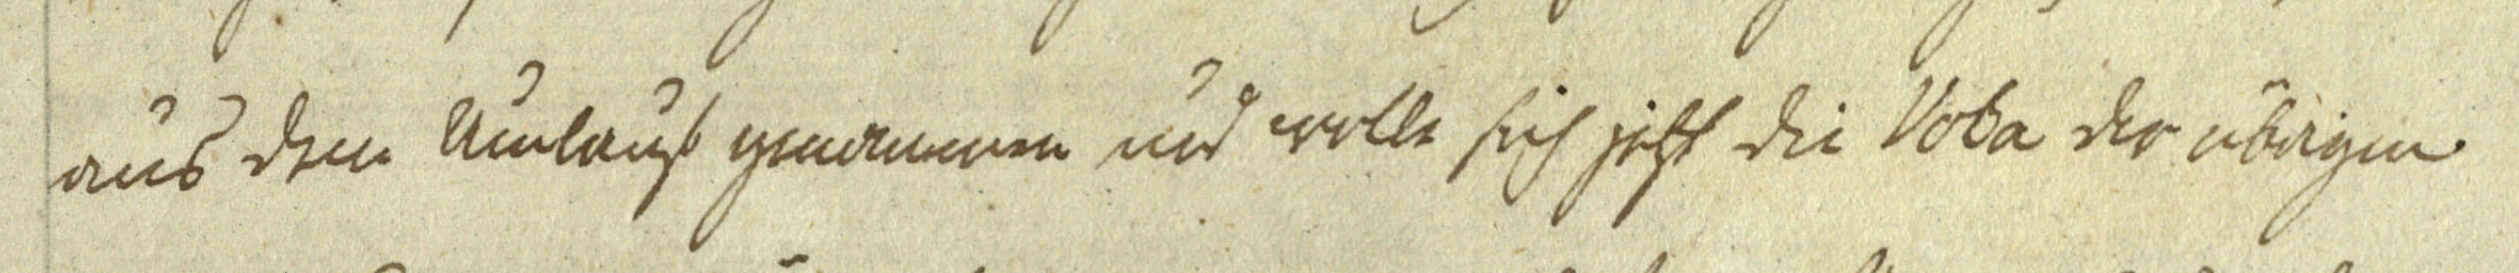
aus dem Umlauf genommen und wolle sich jetzt die Vota der übrigen
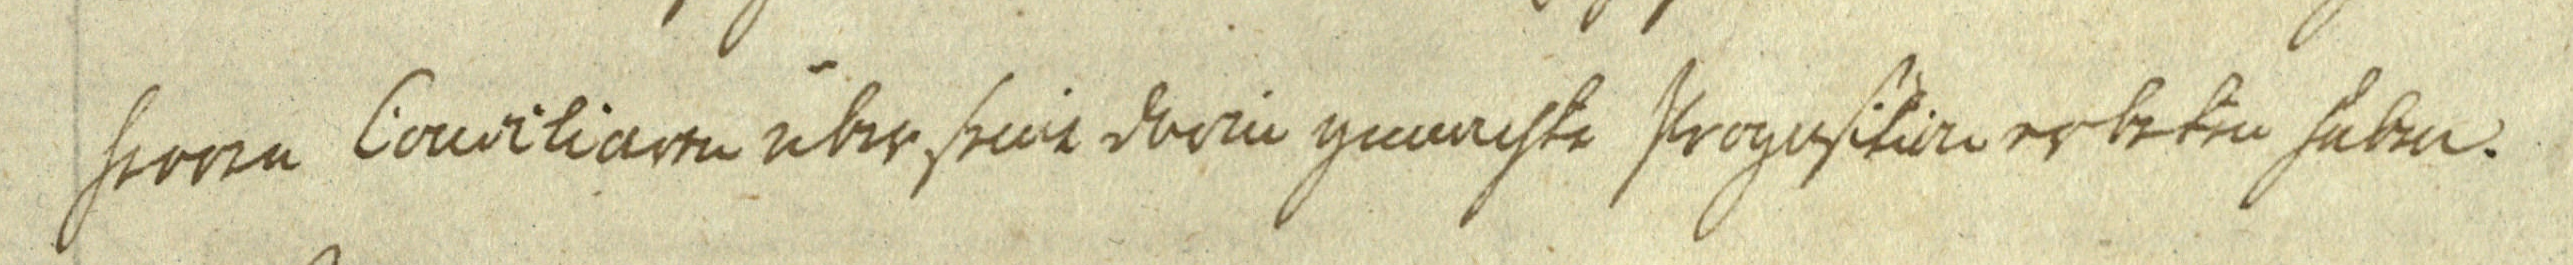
Herren Conciliaren über seine darin gemachte Proposition erbeten haben.
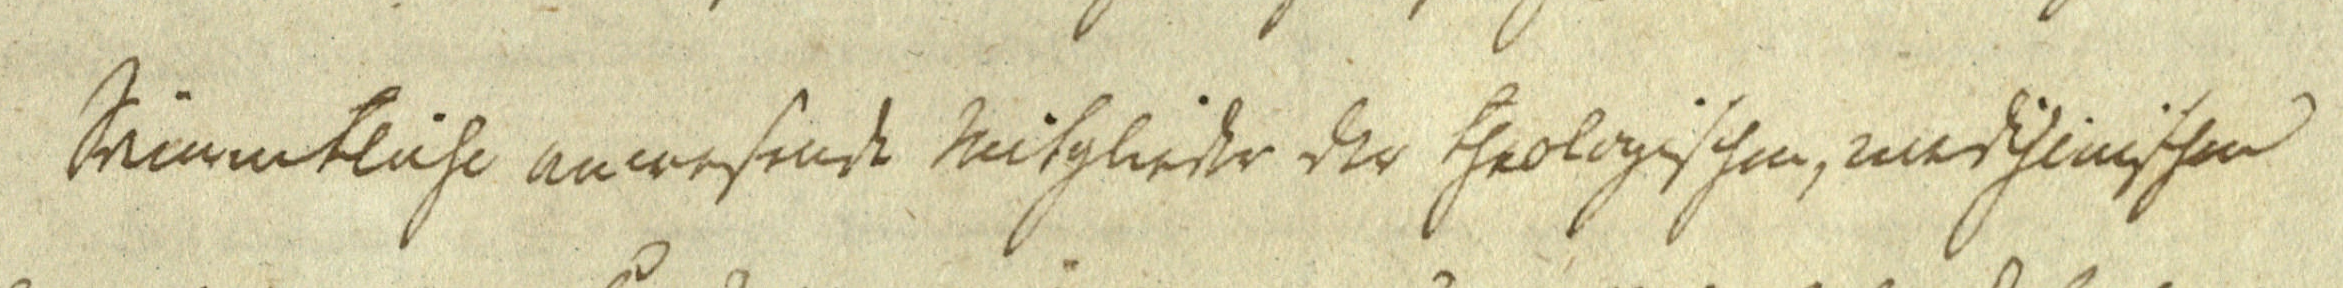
Sämmtliche anwesende Mitglieder der theologischen, medizinischen
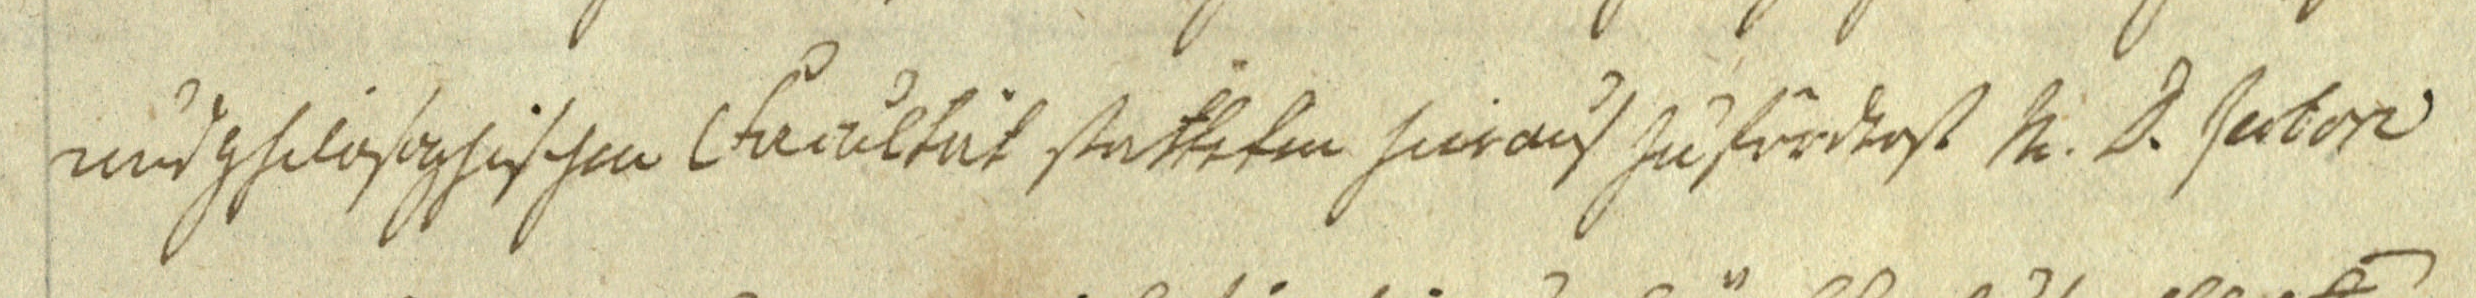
und philosophischen Facultät statteten hierauf zuförderst M. D. Rector
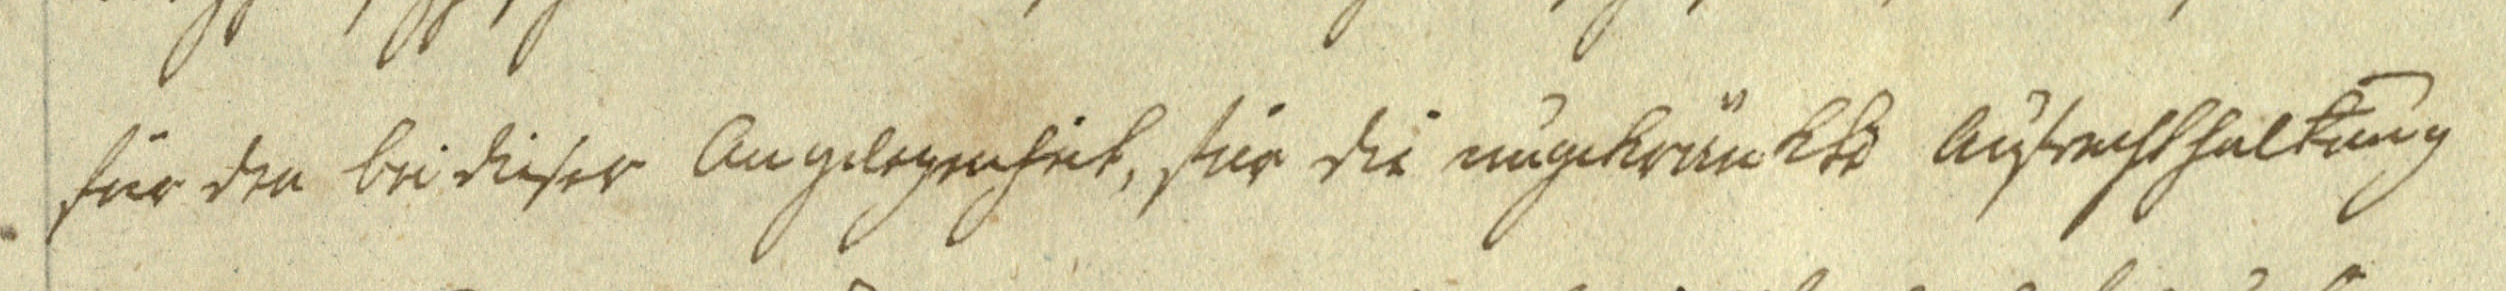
für den bei dieser Angelegenheit, für die ungekränkte Aufrechthaltung
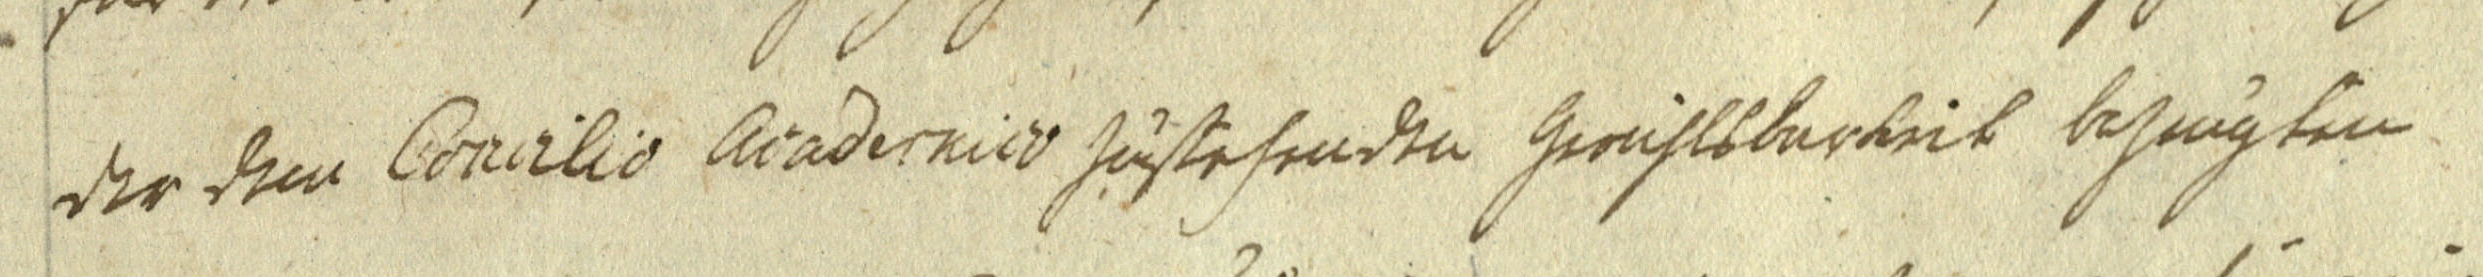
der dem Concilio Academico zustehenden Gerichtsbarkeit bezeugten
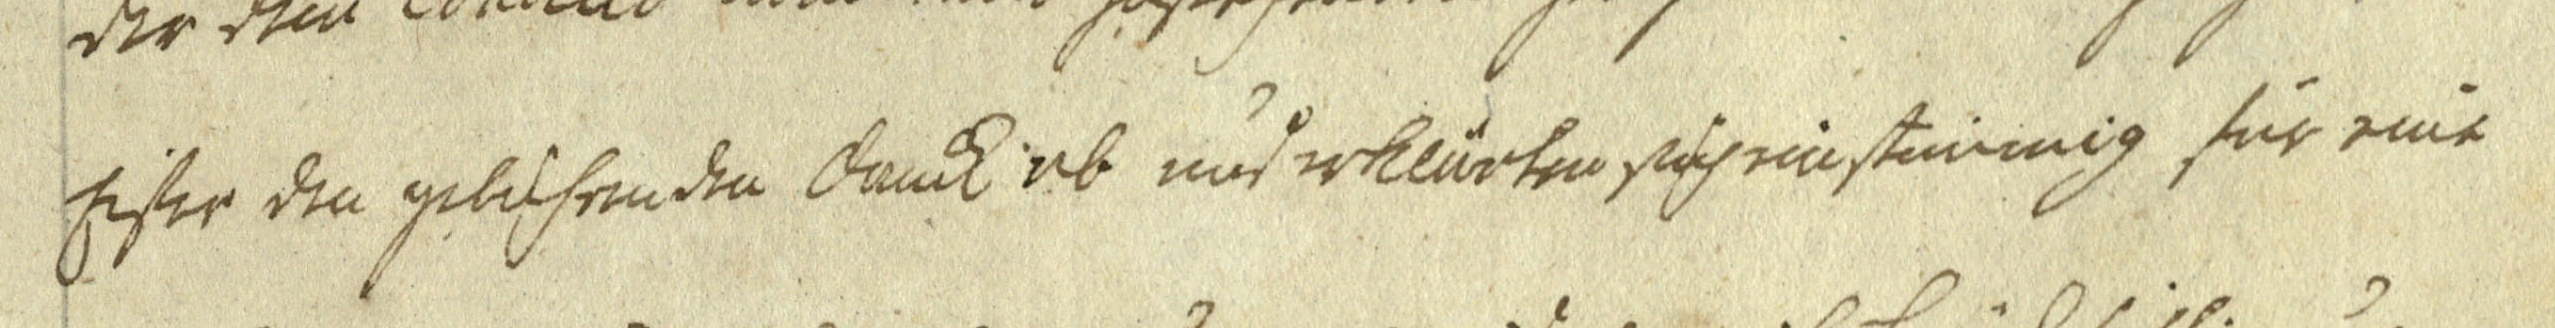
Eifer den gebührenden Danck ab und erklärten sich einstimmig für eine
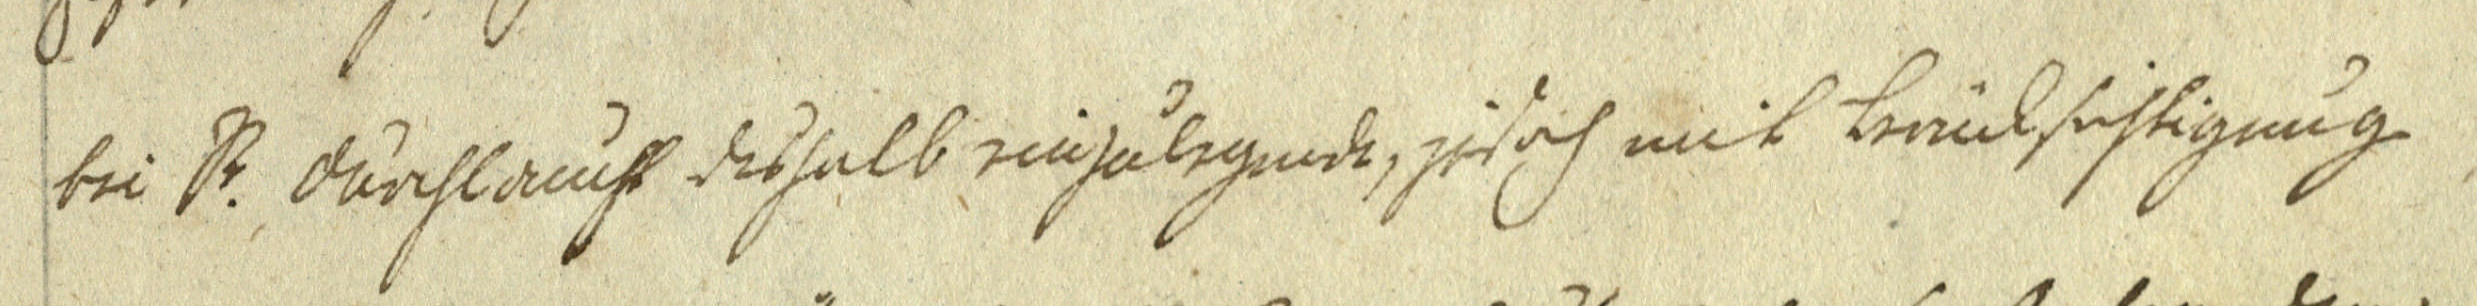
bei Sr. Durchlaucht deshalb einzulegnde, jedoch mit Berücksichtigung
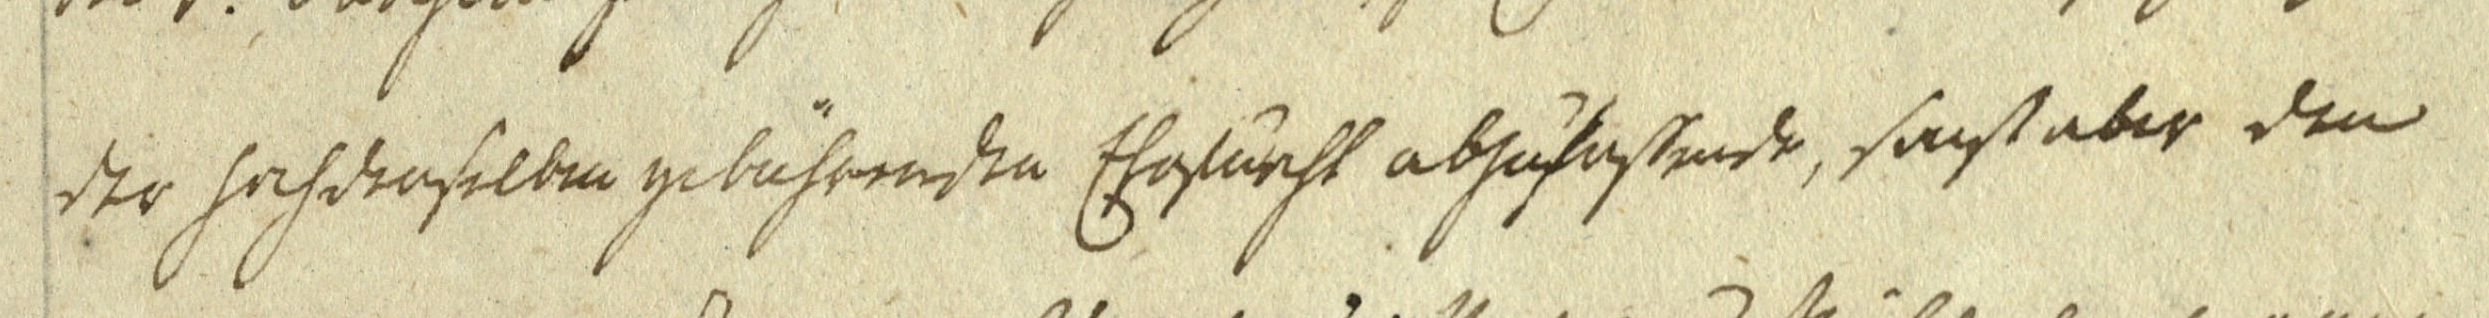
der Hochderselben gebührenden Ehrfurcht abzufassende, sonst aber den
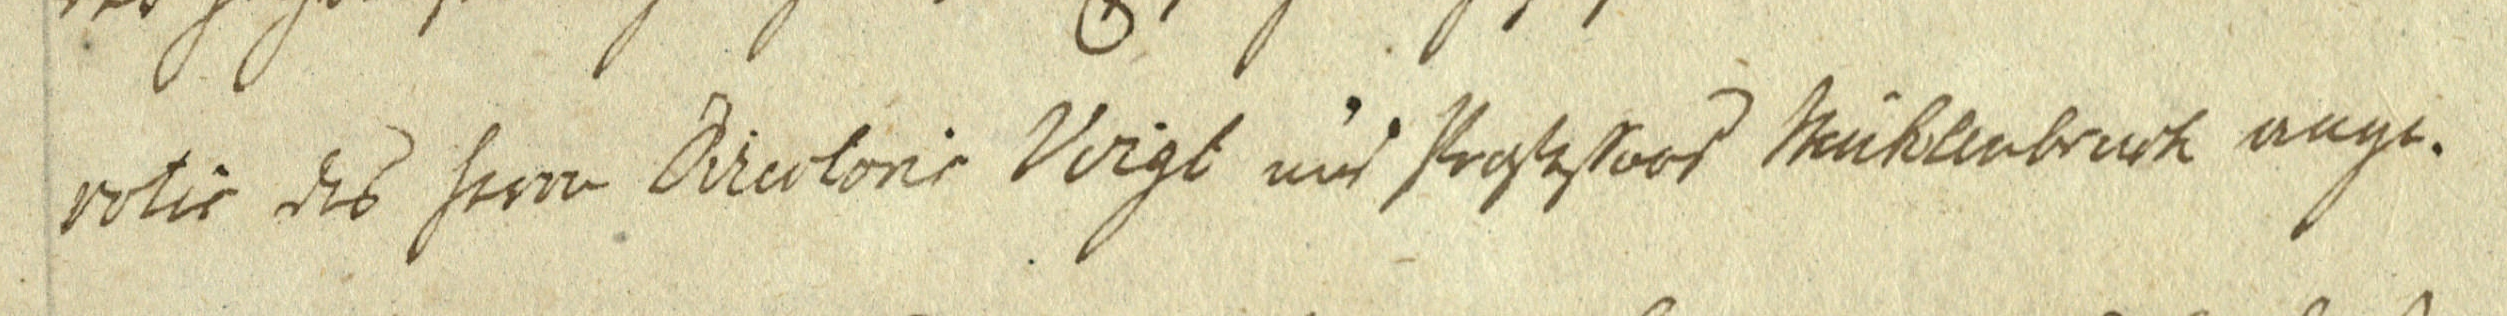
votis des Herrn Directoris Voigt und Professors Mühlenbruch ange¬
